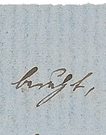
die
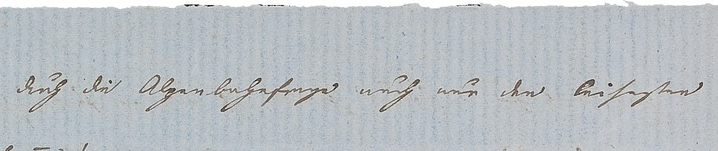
auch nur den leisesten
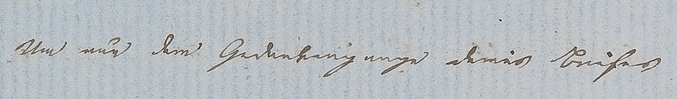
Um nun dem Gedankengange Deines Briefes
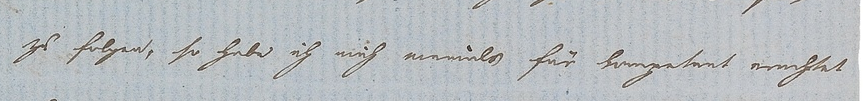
zu folgen, so habe ich mich niemals für kompetent erachtet
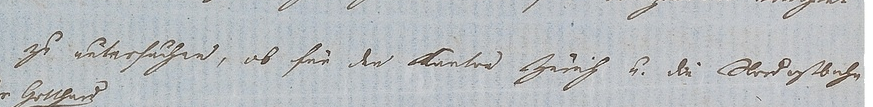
zu untersuchen, ob für den Kanton Zürich u. die Nordostbahn
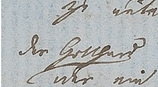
der Gotthard
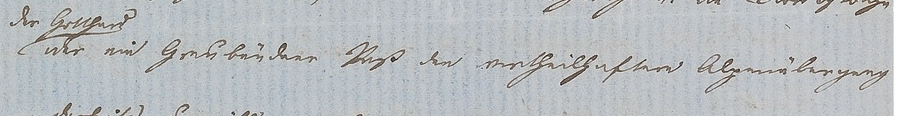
oder ein Graubündner Paß den vortheilhaftern Alpenübergang
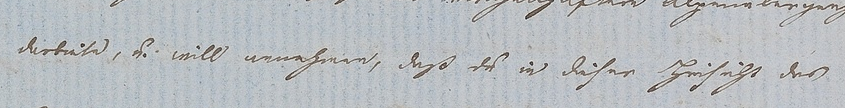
darbiete, u. will annehmen, daß Du in dieser Hinsicht das
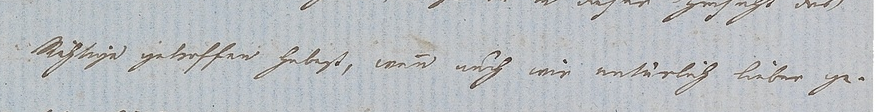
Richtige getroffen habest, wenn auch wir natürlich lieber ge-
